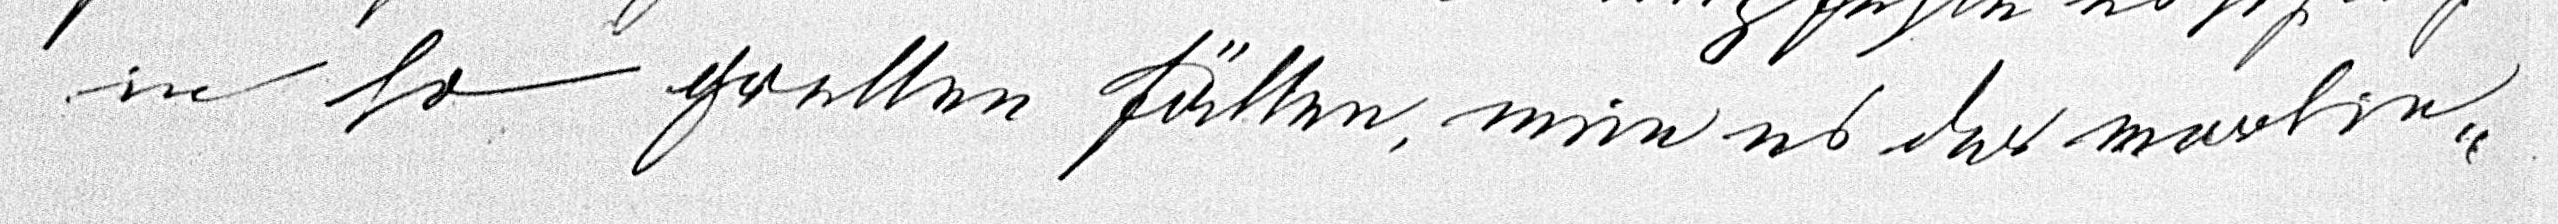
in so grellen fällen, wie es der mxxlie¬
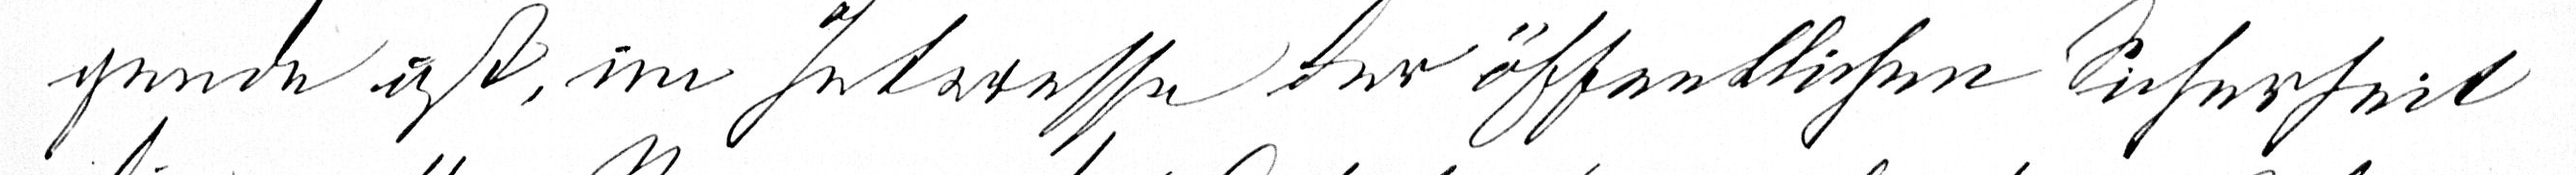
gende ist, im Interesse der öffentlichen Sicherheit
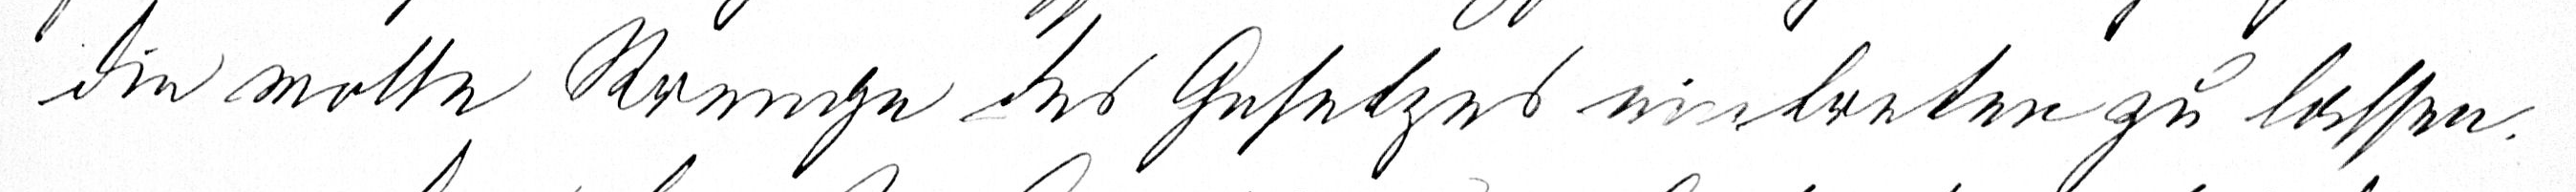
die volle Strenge des Gesetzes eintreten zu lassen.
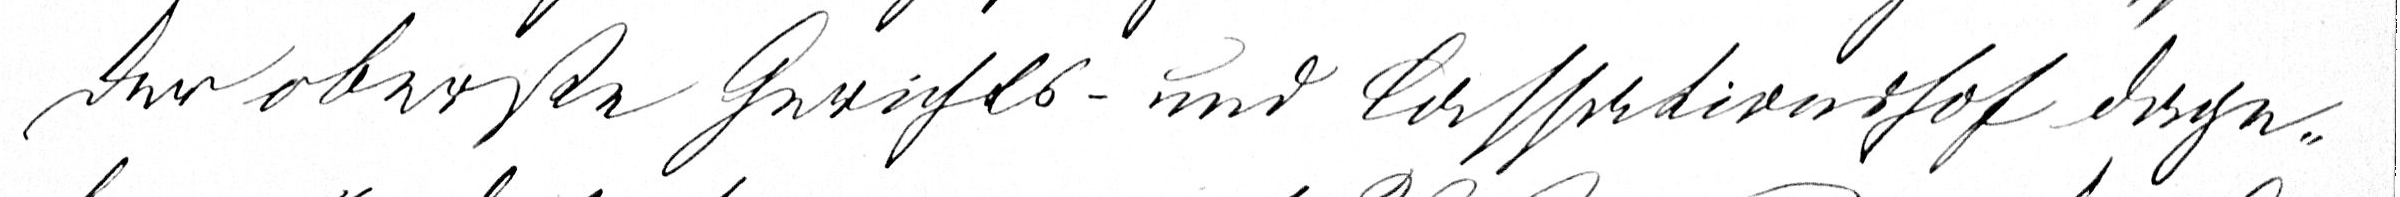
Der oberste Gerichts- und Cassationshof dage¬
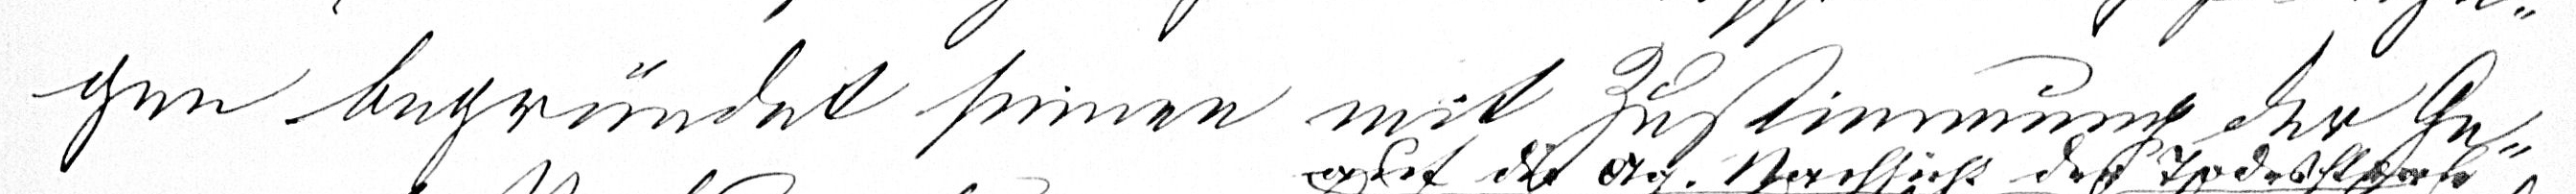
gen begründet seinen mit Zustimmung der Ge¬
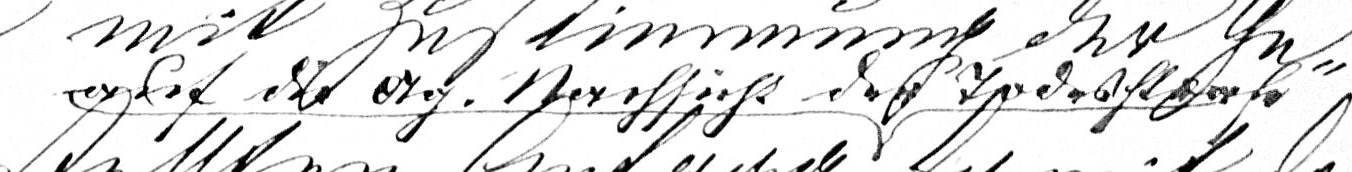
auf die Ag. Nachsicht des Todesstrafe
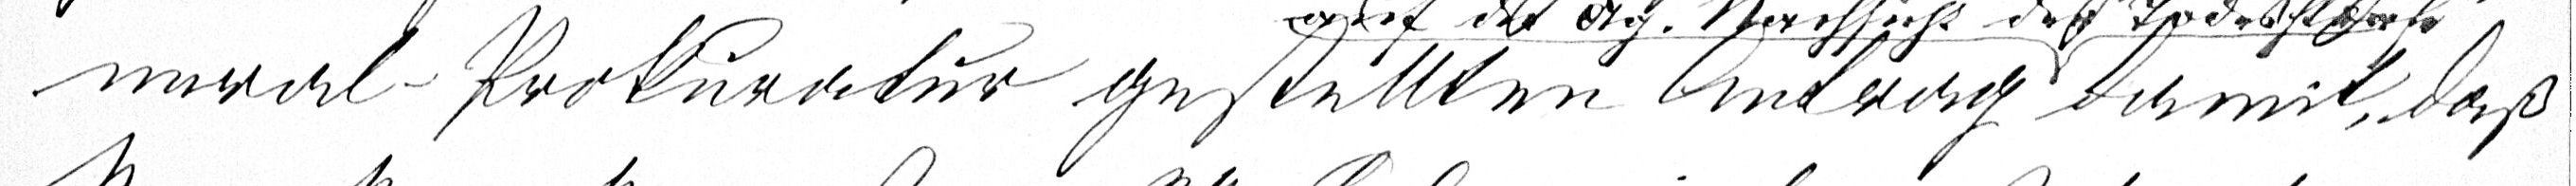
neral-Prokuratur gestellten Antrag damit, daß
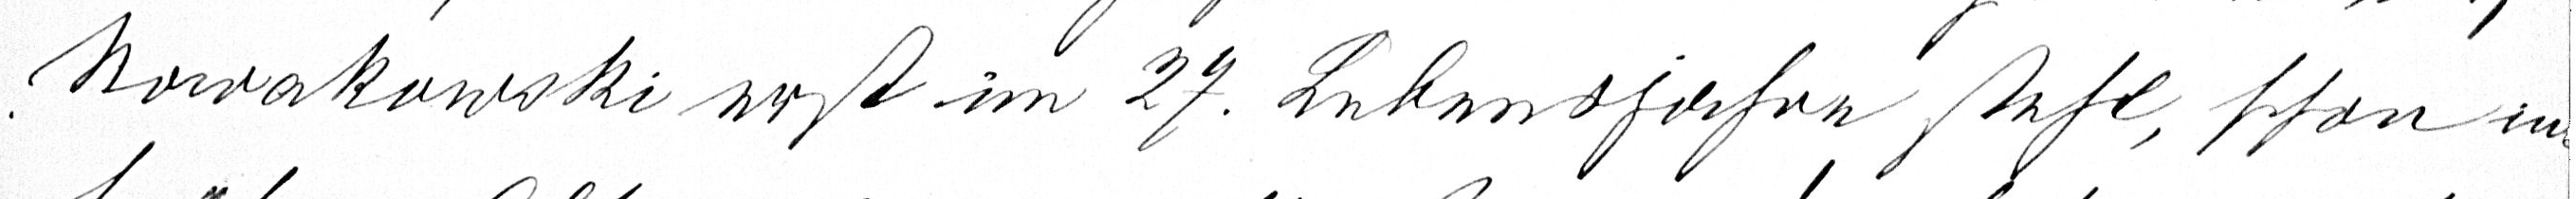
Nowakowski erst im 27. Lebensjahre stehl, schon xx
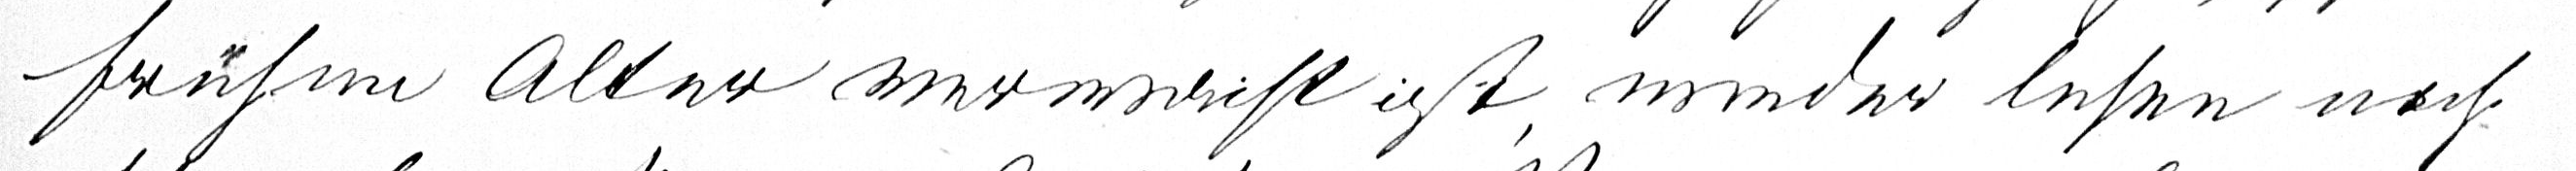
frühen Alter verwacht ist, weder lesen noch
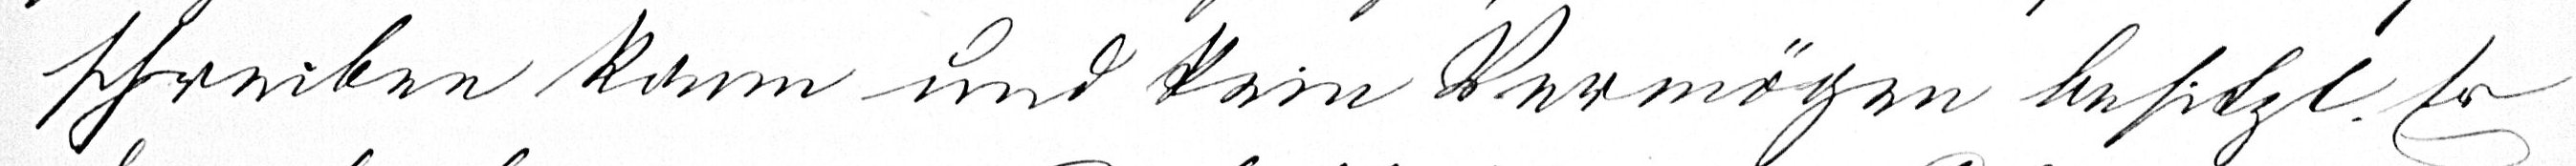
schreiben kann und kein Vermögen besitzt. Er
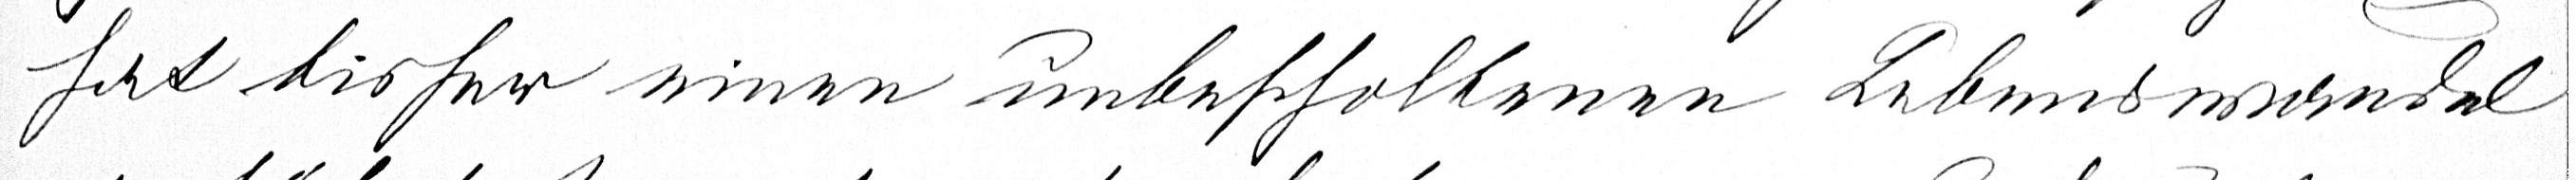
hat bisher einen unbescholtenen Lebenswandel
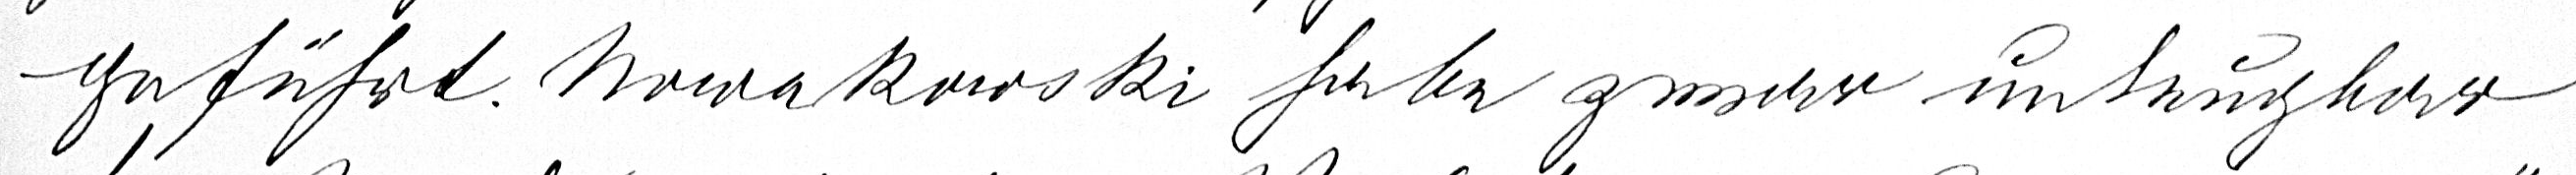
geführt. Nowakowski habe zwar unleugbar
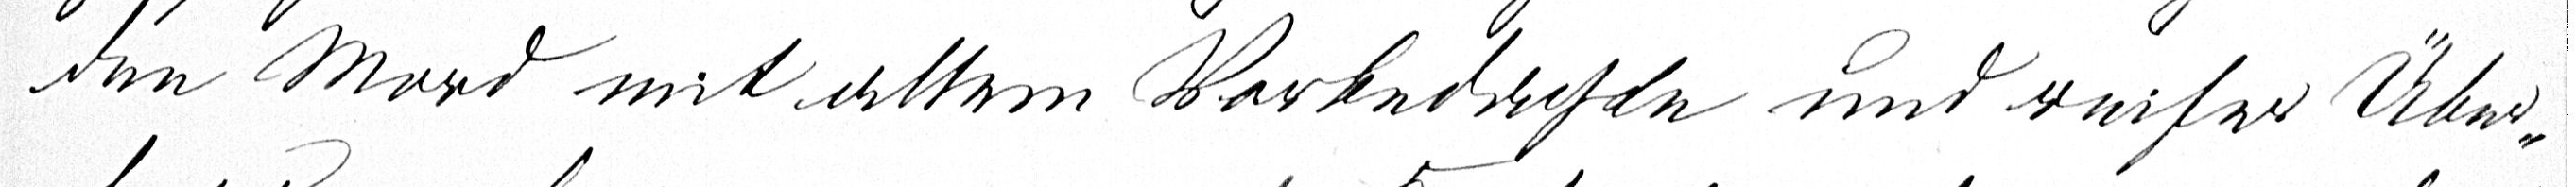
den Mord mit allem Vorbedachter und reiser Über¬
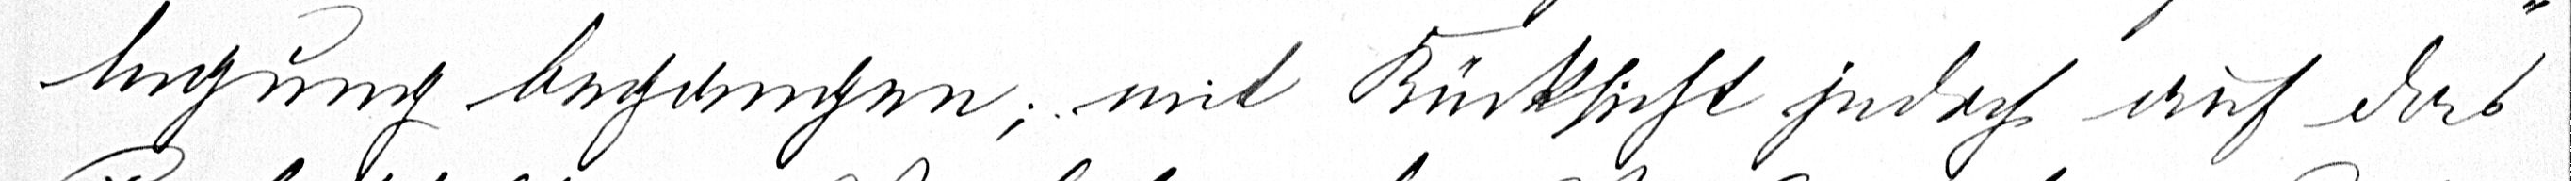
legung begangen; mit Rücksicht jedoch auf das
